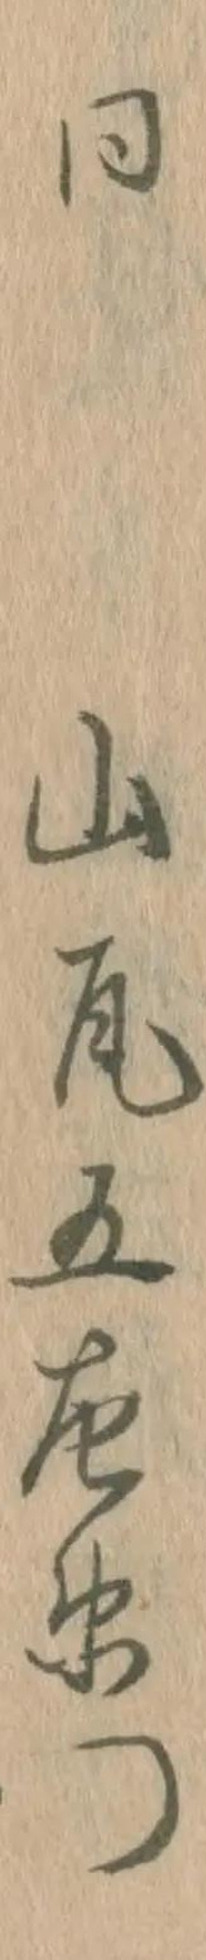同山尾五左衛門
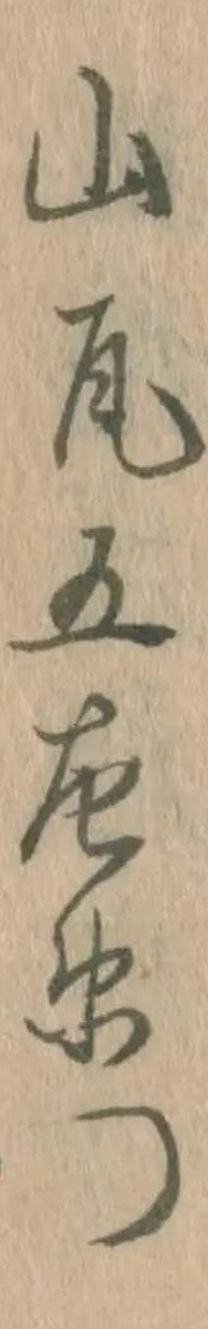同山尾五左衛門
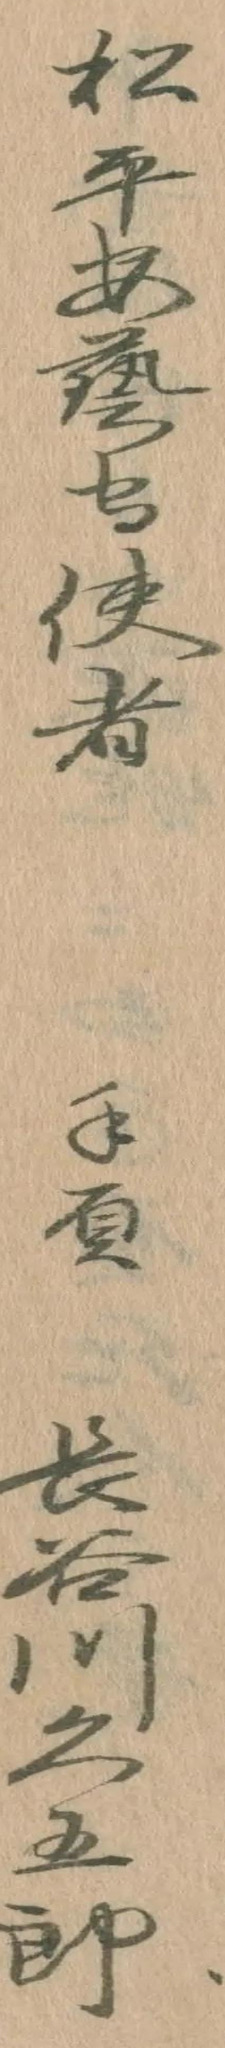松平安芸守使者手負長谷川久五郎
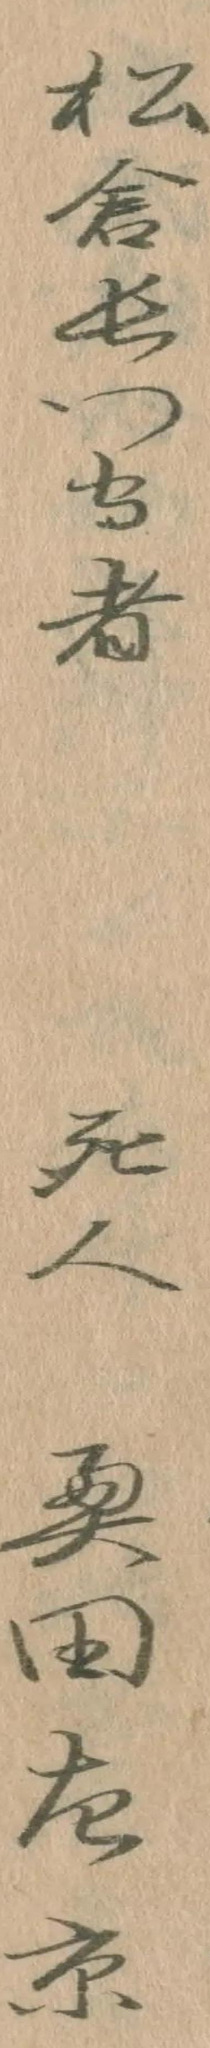松倉長門守者死人奥田左京
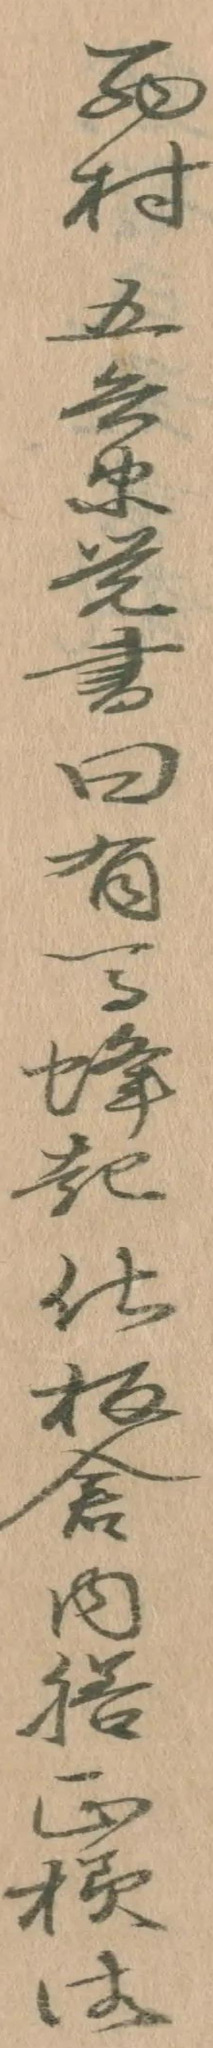西村五兵衛覚書曰有馬蜂起仕板倉内膳正様御
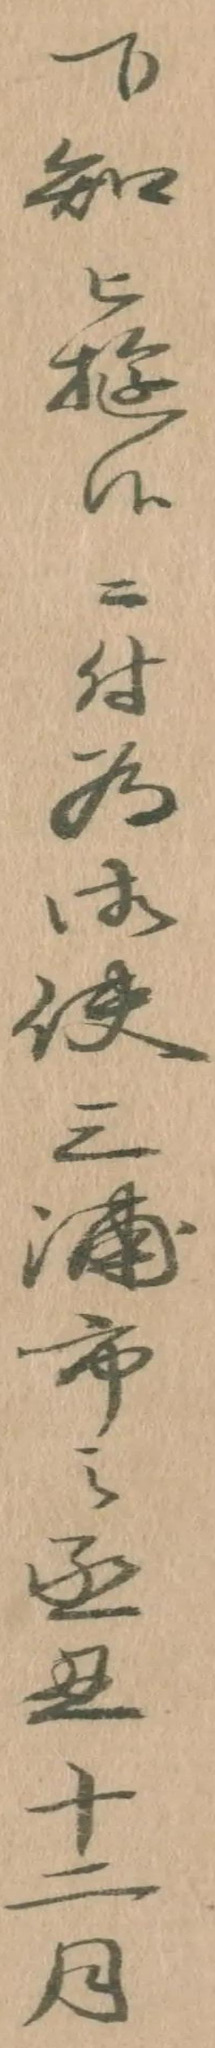下知被遊候に付為御使三浦市之丞丑十二月
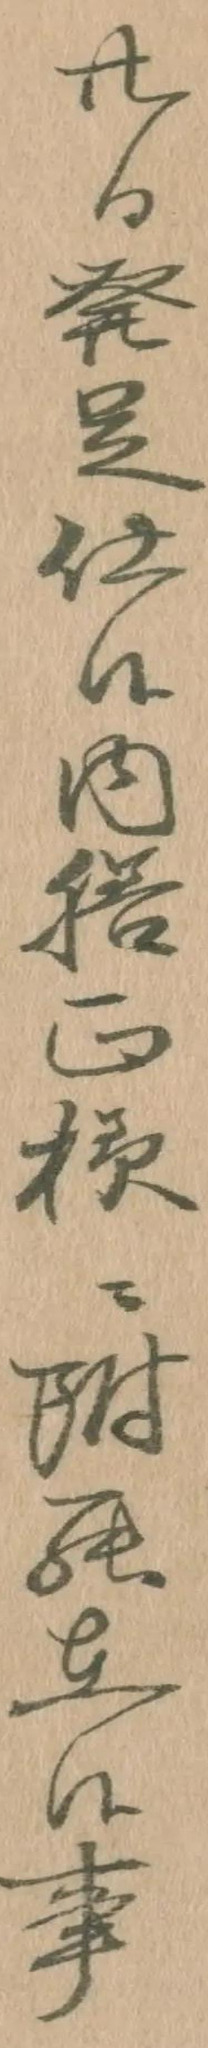廿日発足仕候内膳正様に附罷在候事

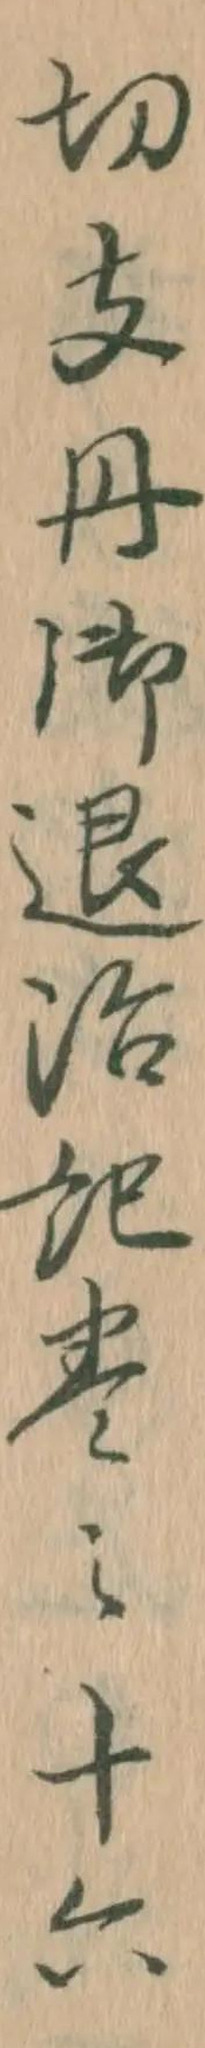切支丹御退治記巻之十六
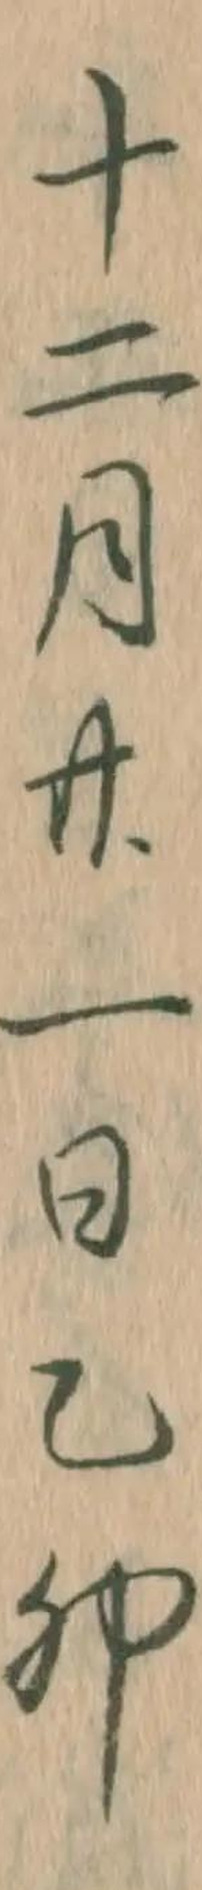十二月廿一日乙夘
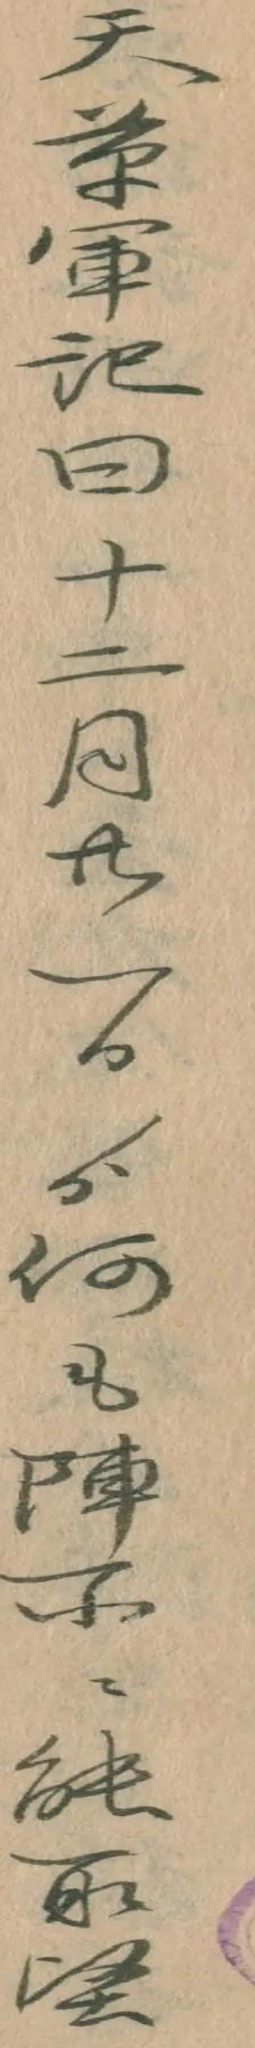天草軍記曰十二月廿一日ゟ何も陣所に能取堅
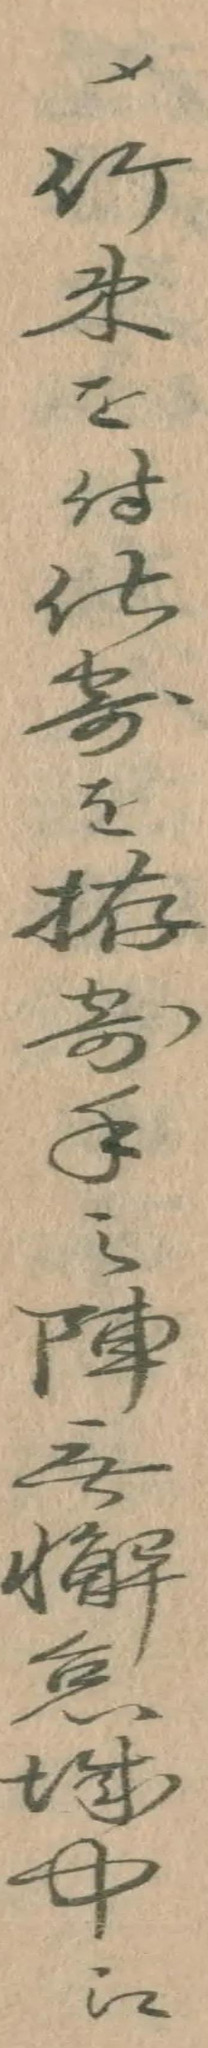め竹束を付仕寄を拵寄手之陣無懈怠城中江
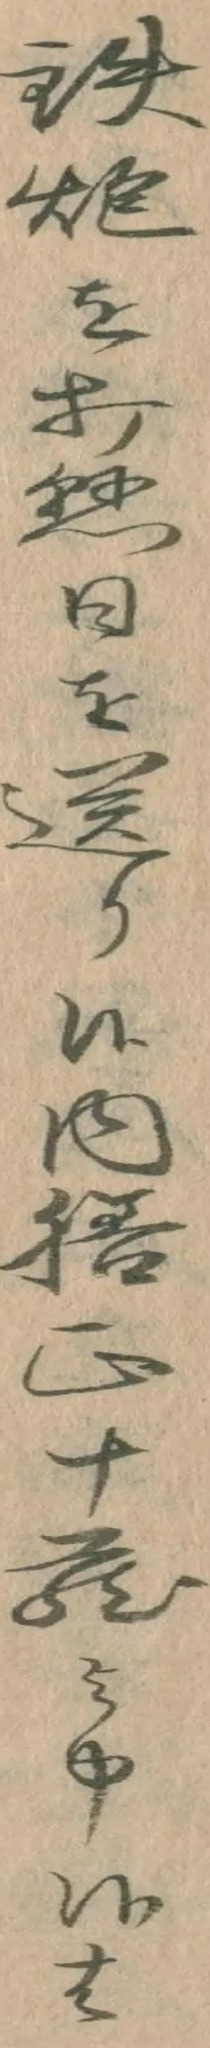鉄炮を打懸日を送り候内膳正十蔵与申候者
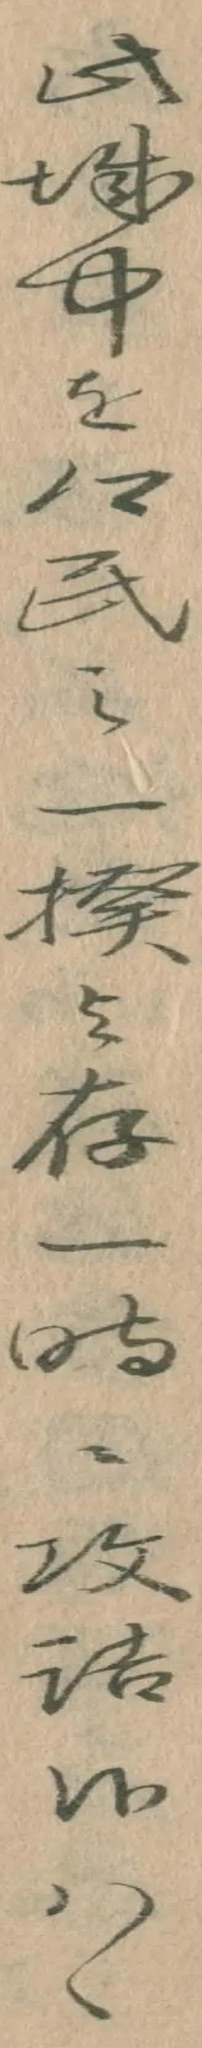此城中を郷民之一揆与存一時に攻詰候はゝ
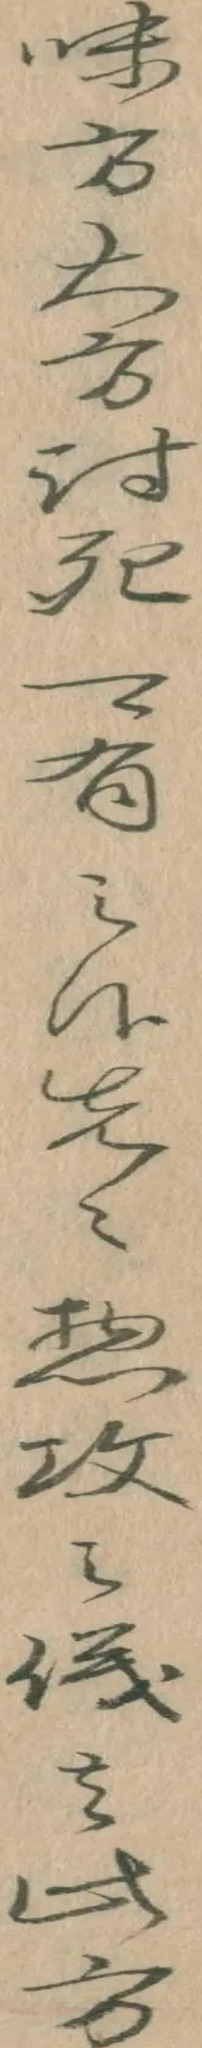味方大方討死可有之候先々惣攻之儀者此方
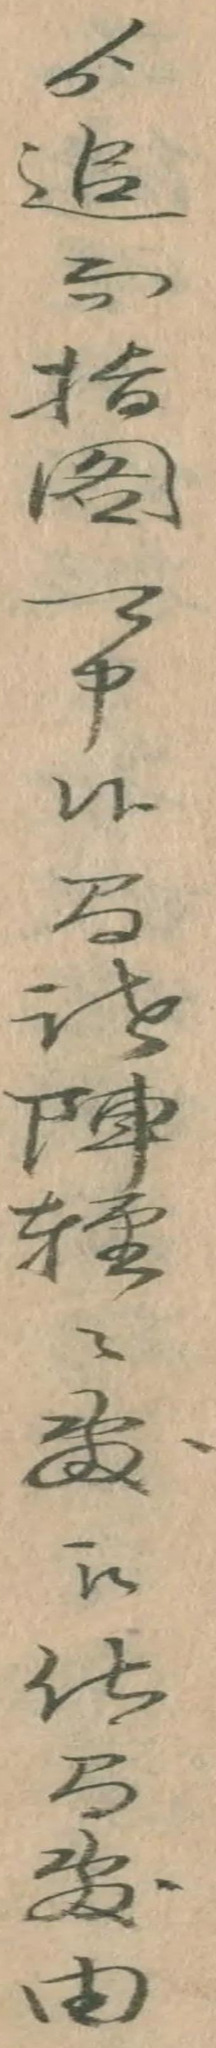ゟ追而指図可申候間諸陣軽々敷被仕間敷由
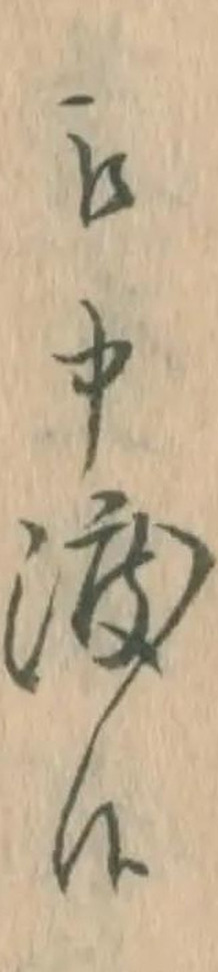被申渡候
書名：切支丹御退治記 49巻. [4]
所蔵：国立国会図書館 National Diet Library, JAPAN
